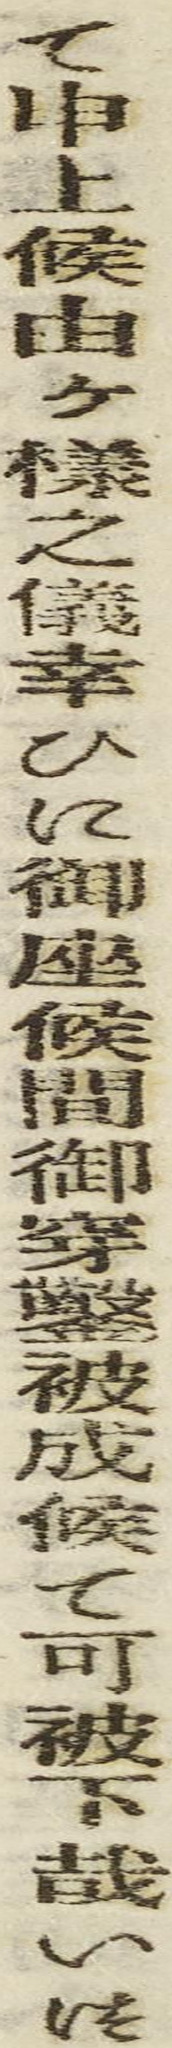て申上候由ヶ樣之儀幸ひに御座候間御穿鑿被成候て可被下哉いす
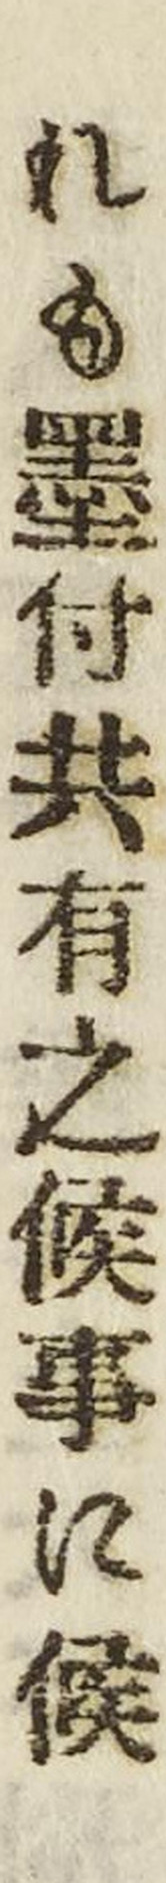れも墨付共有之候事に候
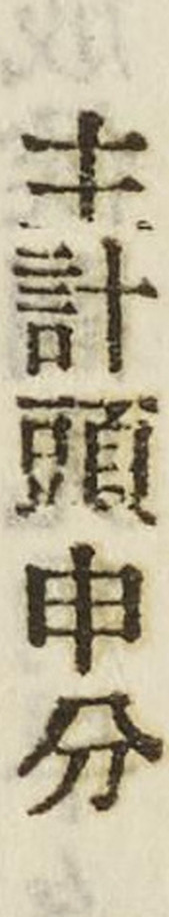主計頭申分
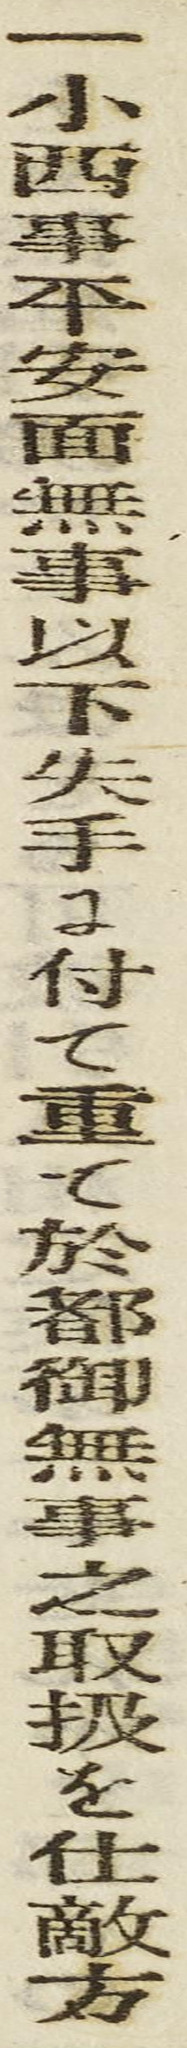一小西事平安面無事以下失手に付て重て於都御無事之取扱を仕敵方
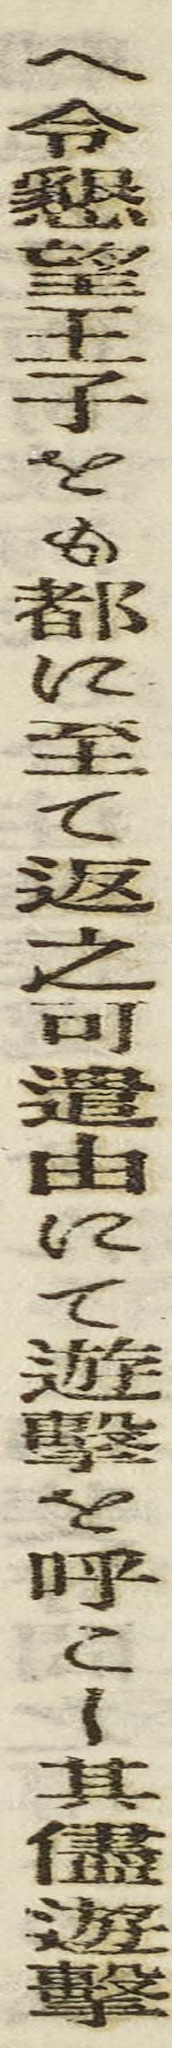へ令懇望王子をも都に至て返之可遣由にて遊撃を呼こし其儘遊撃
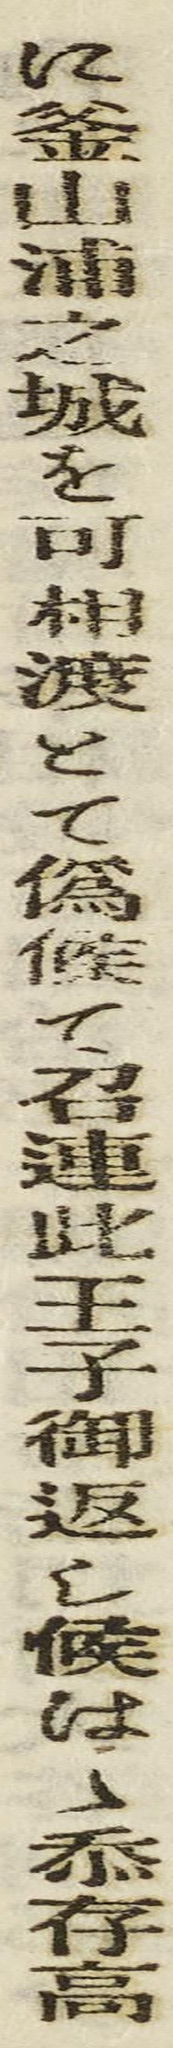に釜山浦之城を可相渡とて偽候て召連此王子御返し候はゝ忝存高
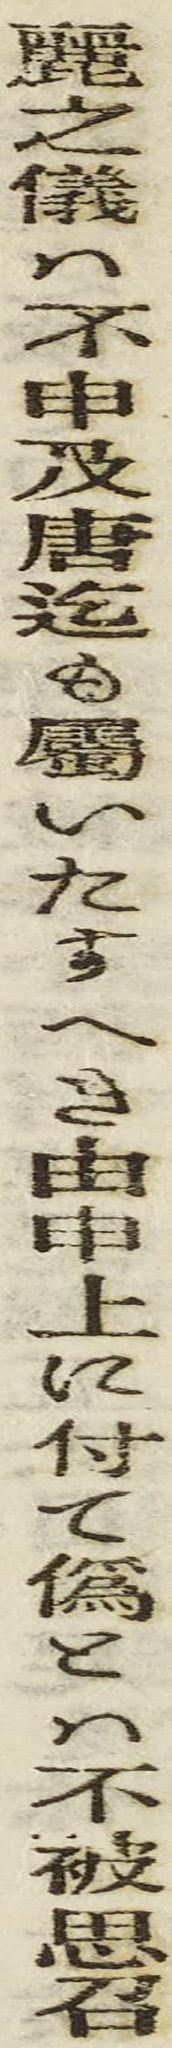麗之儀ハ不申及唐迄も属いたすへき由申上に付て偽とハ不被思召
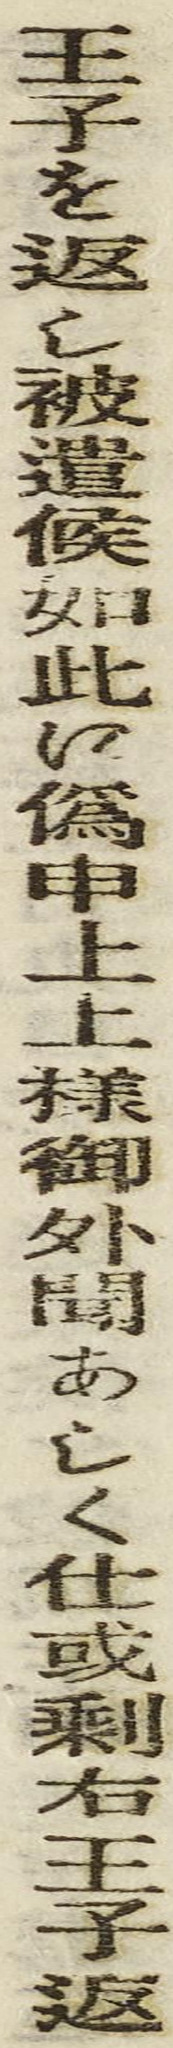王子を返し被遣候如此に偽申上上様御外聞あしく仕或剰右王子返
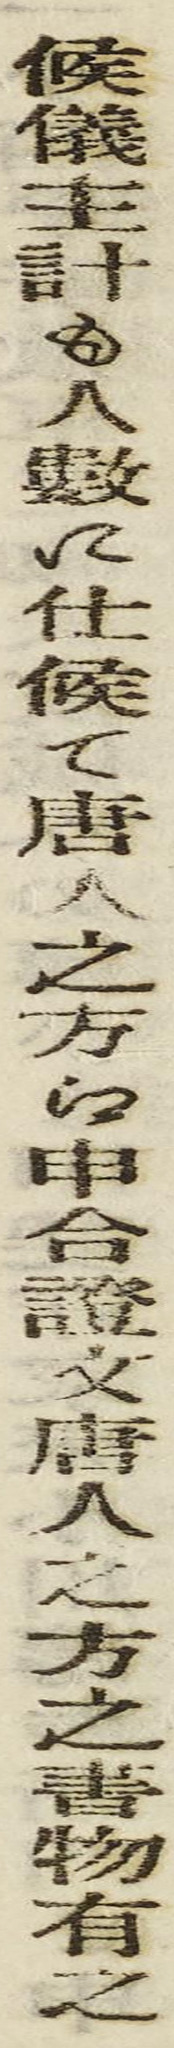候儀主計も人数に仕候て唐人之方え申合證文唐人之方之書物有之
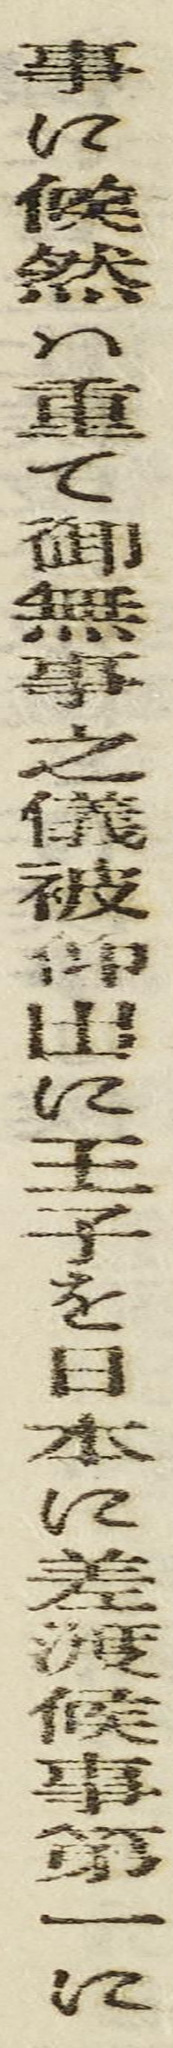事に候然ハ重て御無事之儀被仰出に王子を日本に差渡候事第一に
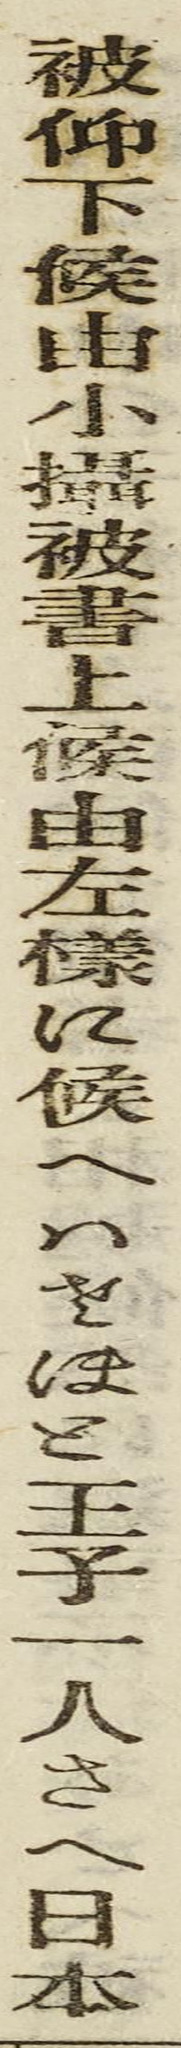被仰下候由小摂被書上候由左様に候へハさほと王子一人さへ日本
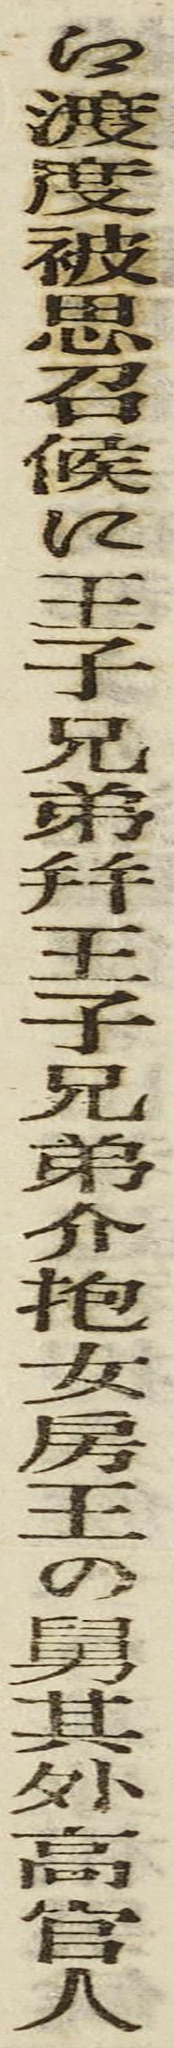え渡度被思召候に王子兄弟幷王子兄弟介抱女房王の舅其外高官人
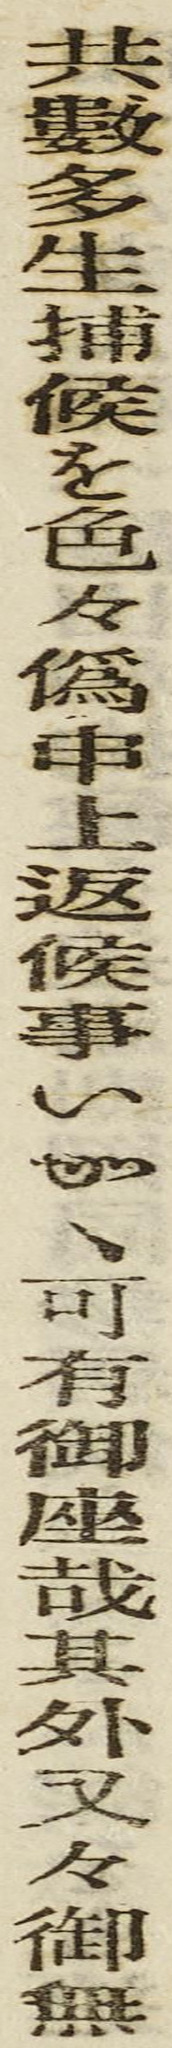共数多生捕候を色々偽申上返候事いかゝ可有御座哉其外又々御無
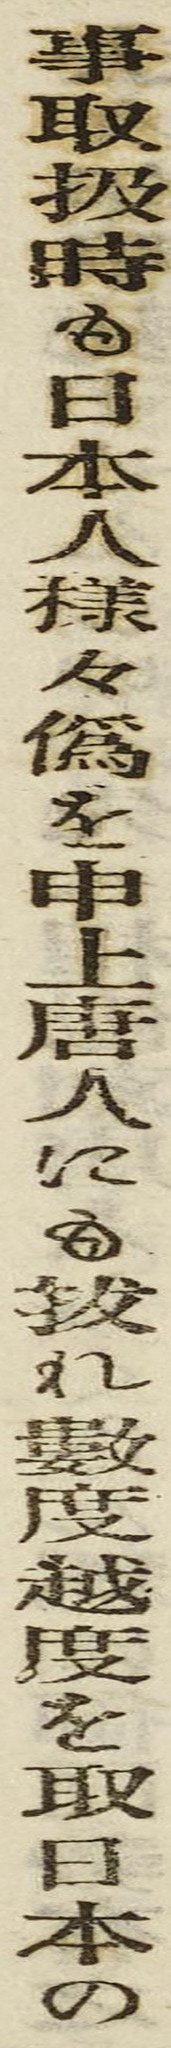事取扱時も日本人様々偽を申上唐人にも抜れ数度越度を取日本の
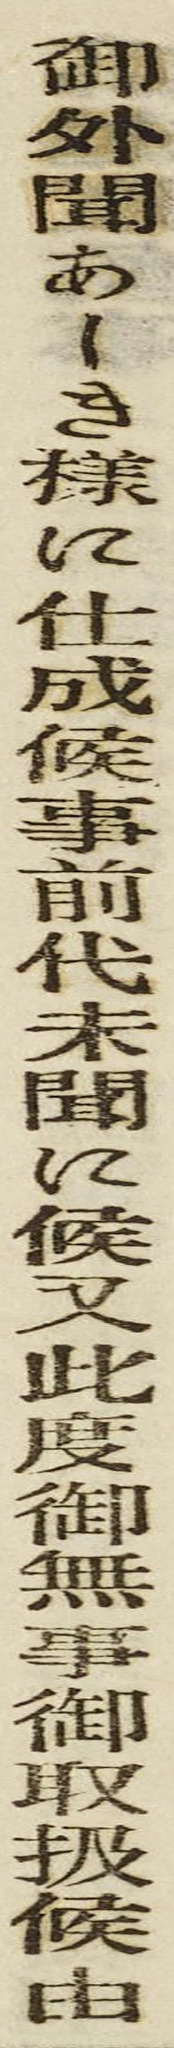御外聞あしき様に仕成候事前代未聞に候又此度御無事御取扱候由
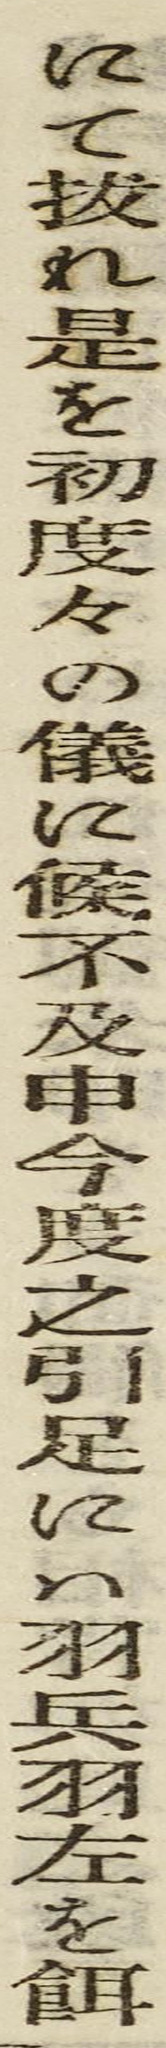にて抜れ是を初度々の儀に候不及申今度之引足にハ羽兵羽左を餌
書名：史籍集覽　朝鮮陣古文・細井廣澤記・颶風紀事・天明七年將軍宣下次第書　全
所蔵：東京大学地震研究所図書室 Earthquake Research Institute Library, The University of Tokyo, JAPAN
